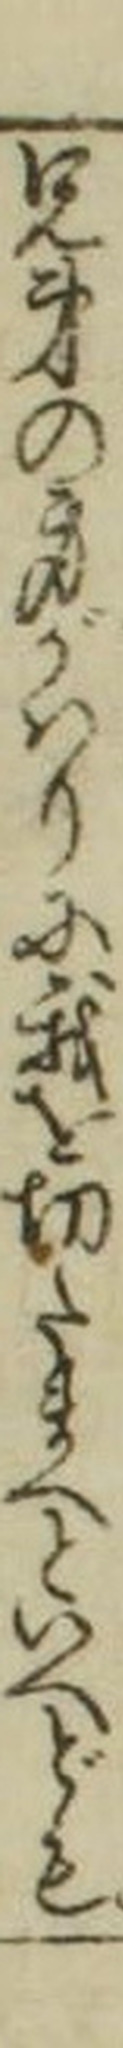兄弟の身がはりに我を切たまへといへども。
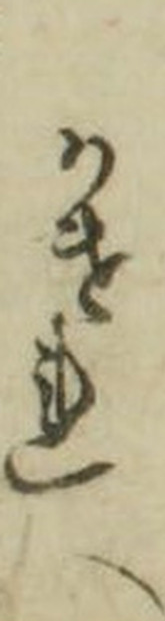かけれ
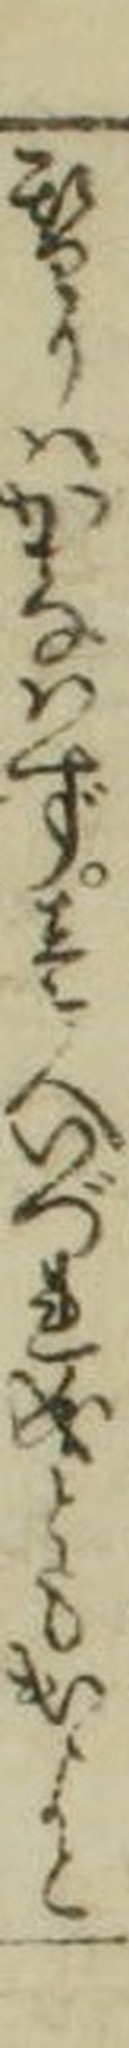替りはかなはず。壱人いづれ成とも出よと
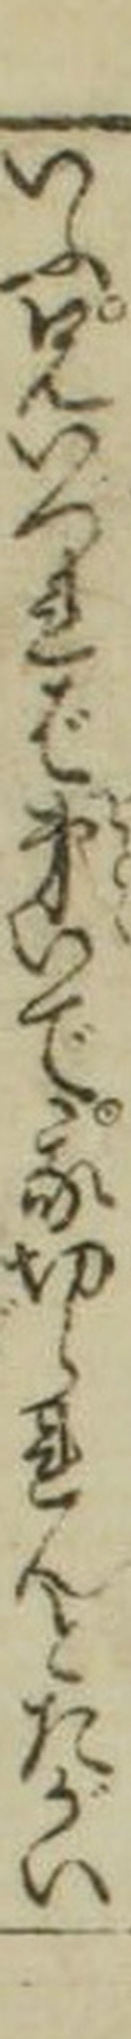いふ。兄いづれば弟いで。我切られんとたがい
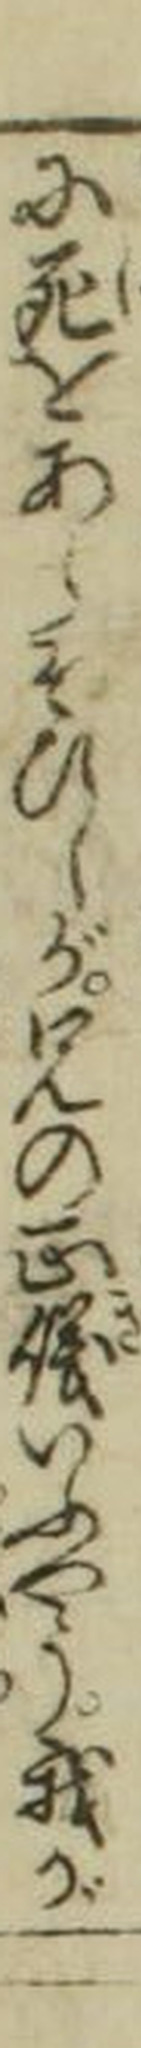に死をあらそひしが。兄の正儀いふやう。我が
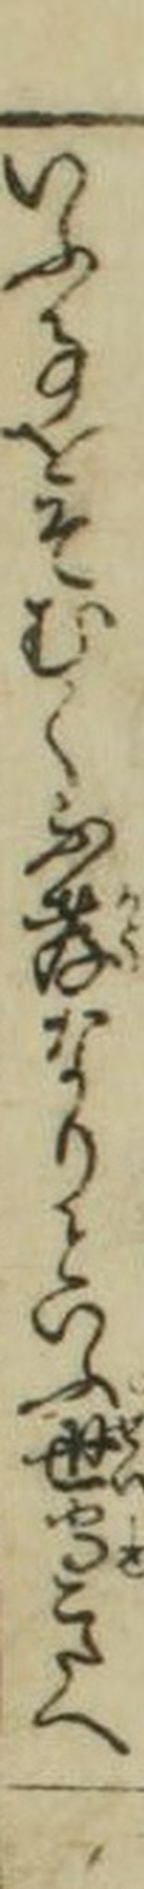いふ事をそむく不孝なりといふ。世守こたへ

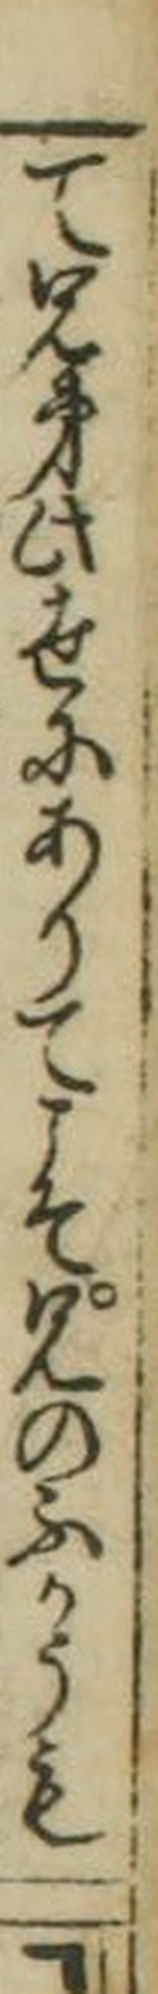て兄弟此世にありてこそ。兄のふかうも
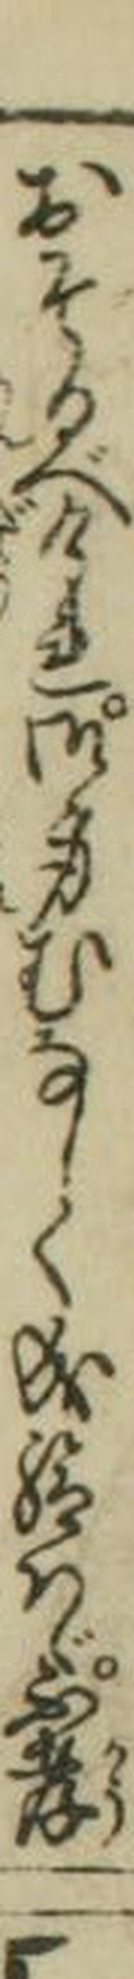おそるべけれ。御身むなしく成給はゞ。不孝
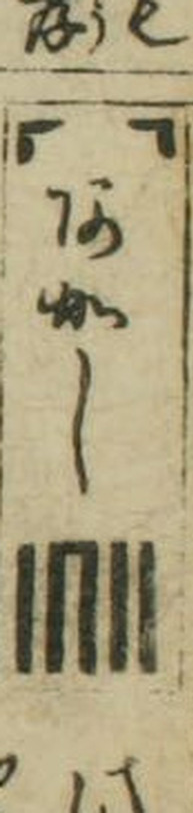あかし
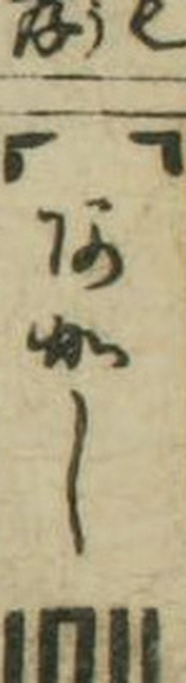あかし
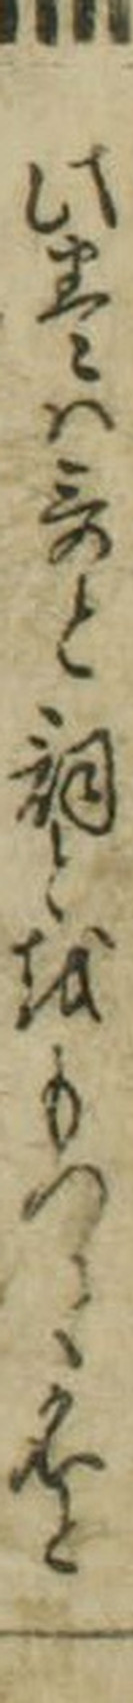此巻は哥と詞をもつて名と
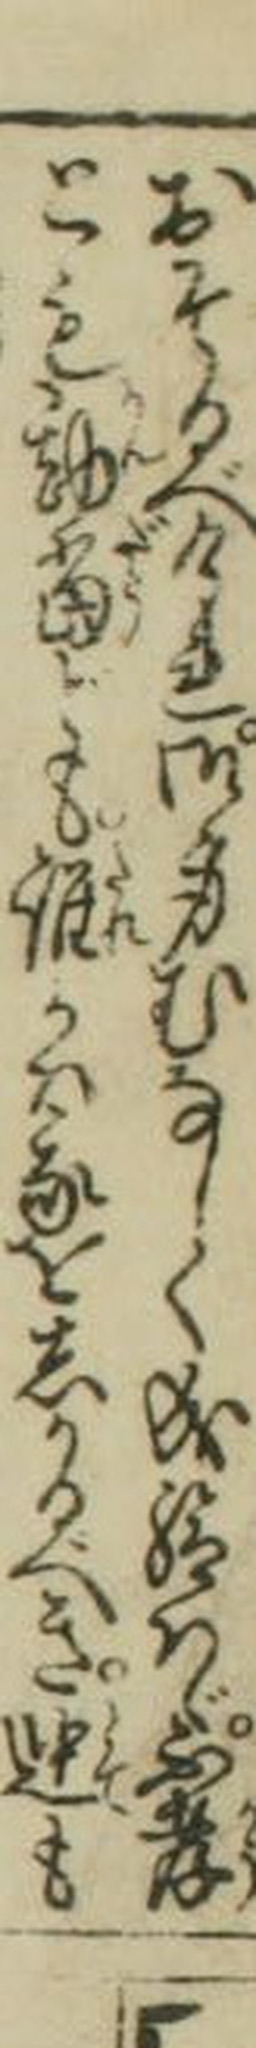とも勘当とも。誰かは我をしかるべき。迚も
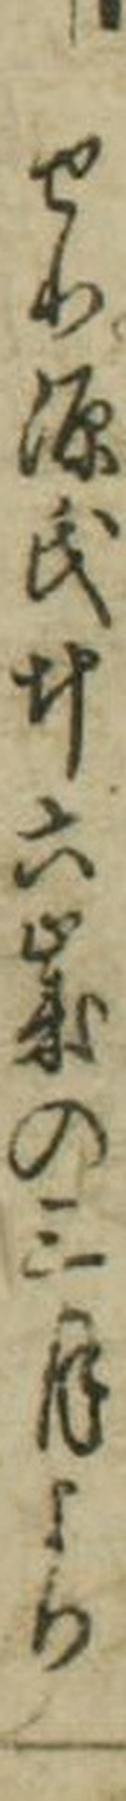せり。源氏廿六歳の三月より
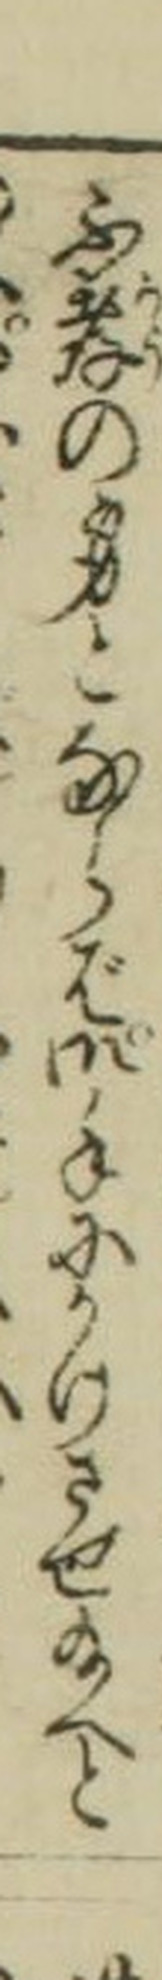不孝の身とならば。御手にかけさせ給へと
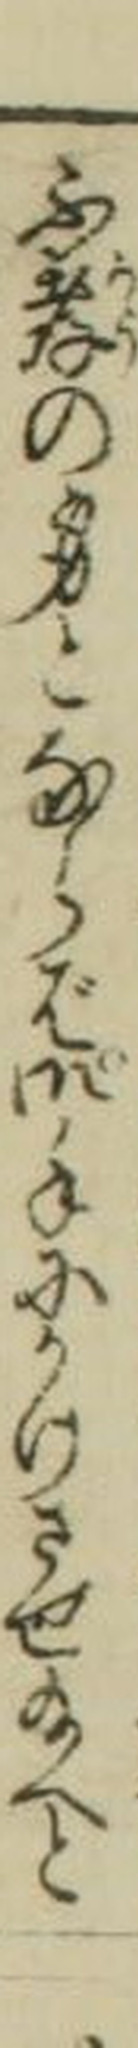不孝の身とならば。御手にかけさせ給へと
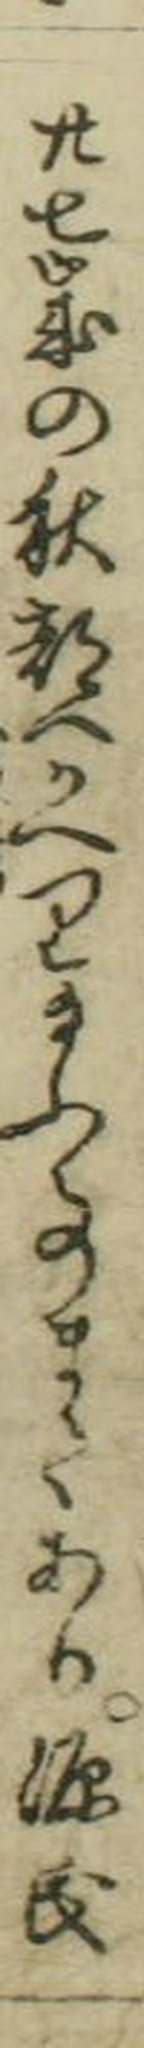廿七歳の秋都へかへり給ふ事まてあり。源氏
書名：女源氏教訓鑑
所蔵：東京学芸大学附属図書館
